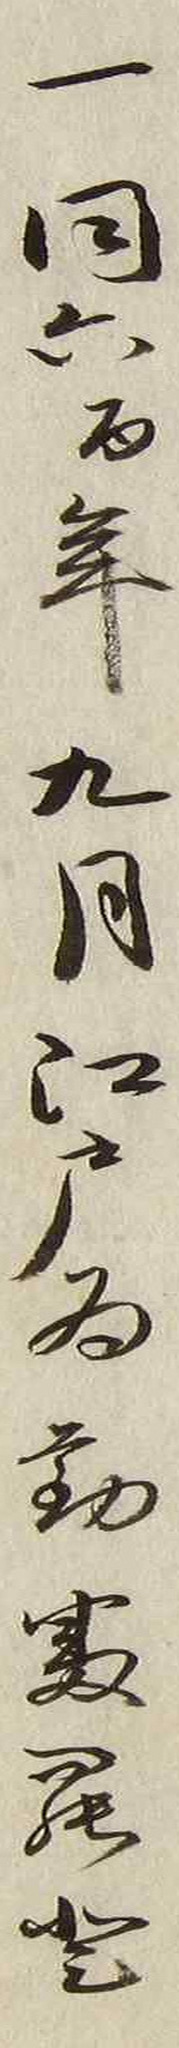一同六酉年九月江戸為勤番罷登
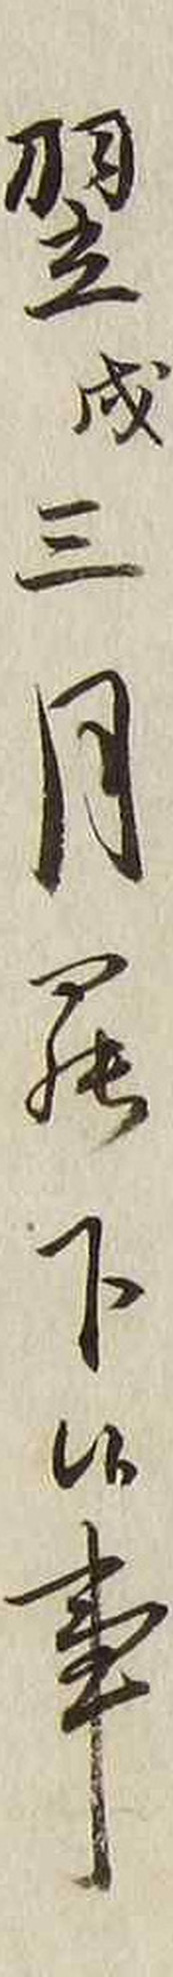翌戌三月罷下候事

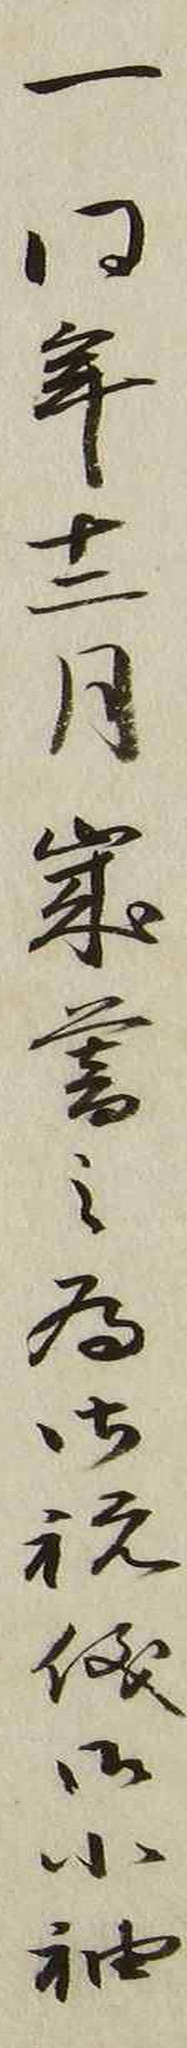一同年十二月歳暮之為御祝儀御小袖
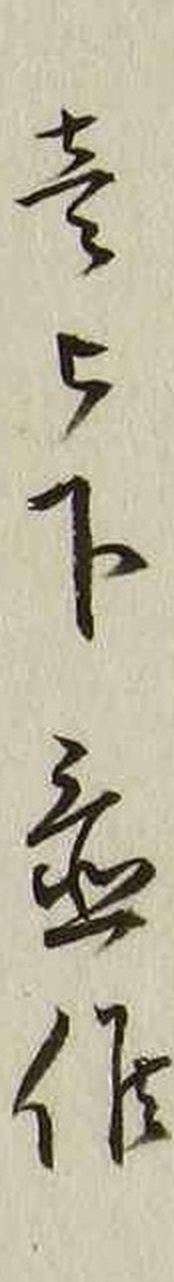壱被下置候
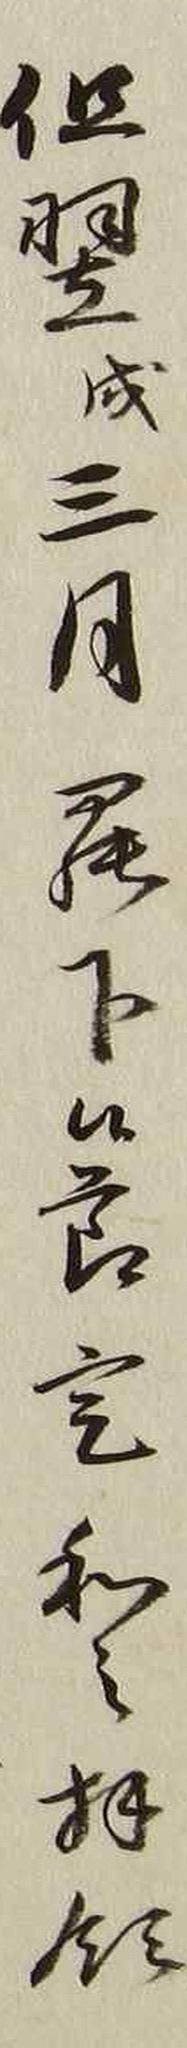但翌戌三月罷下候節定和之拝領
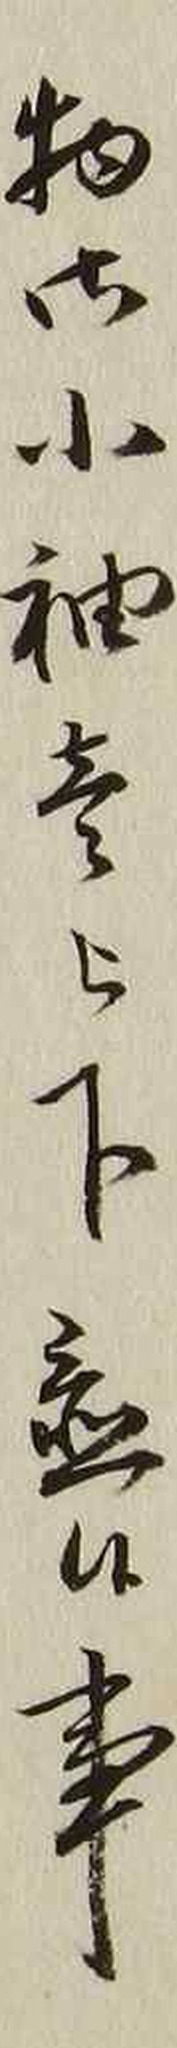物御小袖壱被下置候事
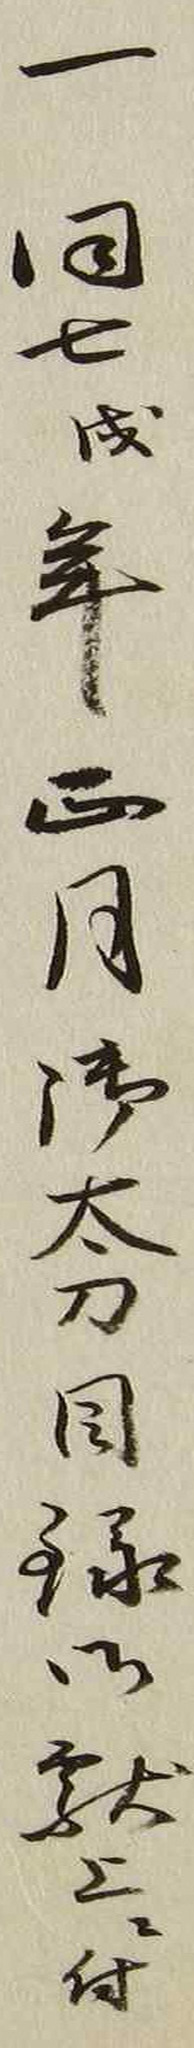一同七戌年正月御太刀目録御献上ニ付
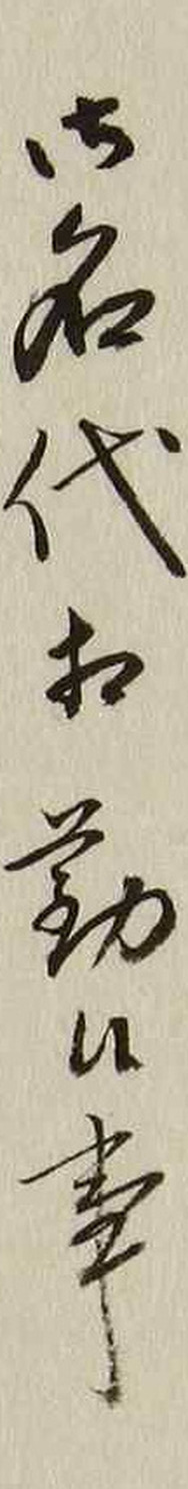御名代相勤候事
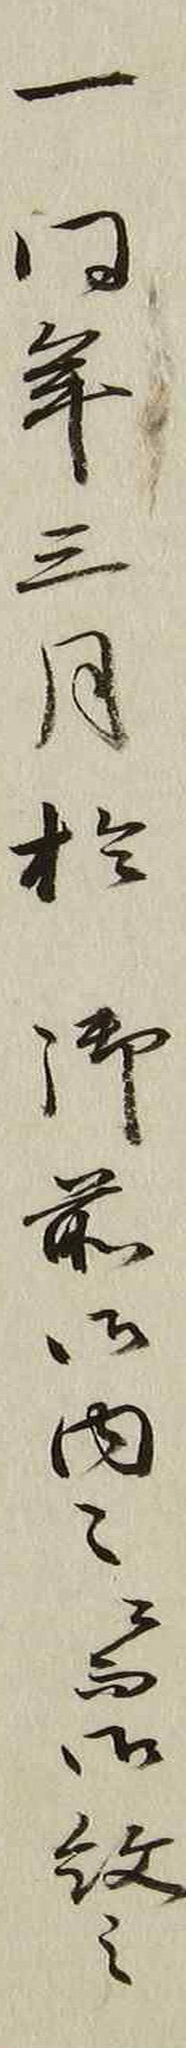一同年三月於御前御内々ニ而御紋之
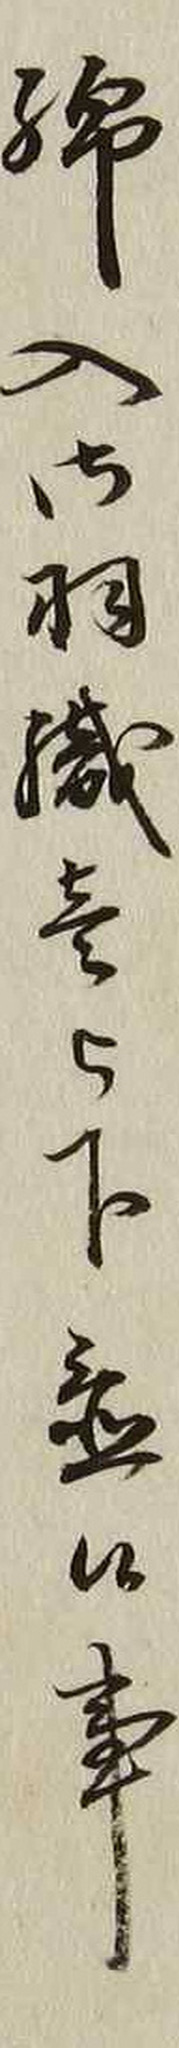綿入御羽織壱被下置候事
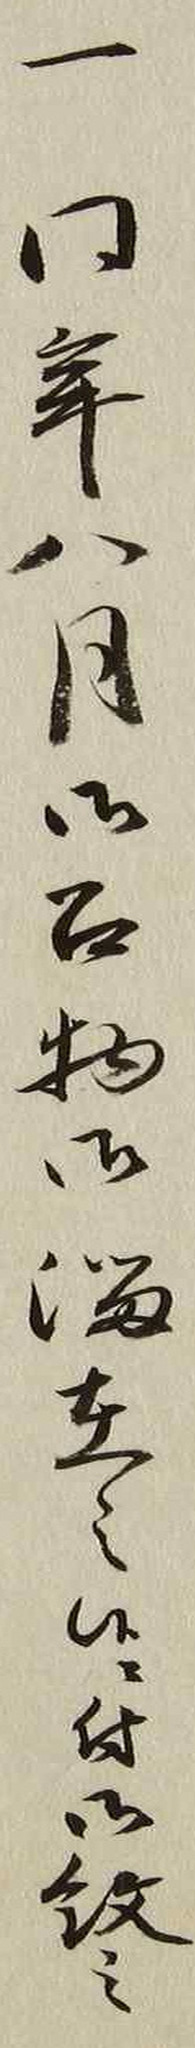一同年八月御召物御溜在之候ニ付御紋之
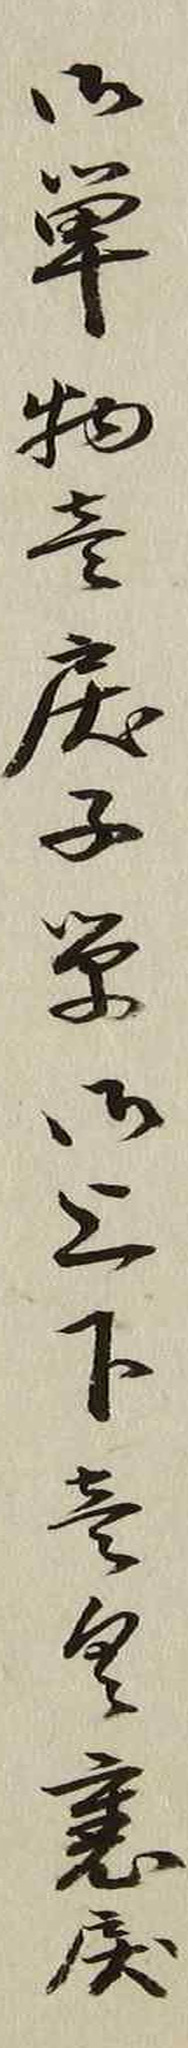御単物壱戻子単御上下壱具裏戻
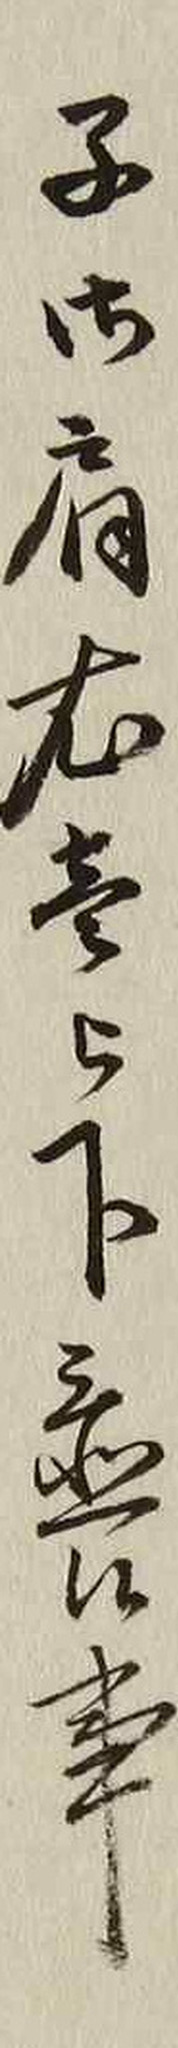子御肩衣壱被下置候事
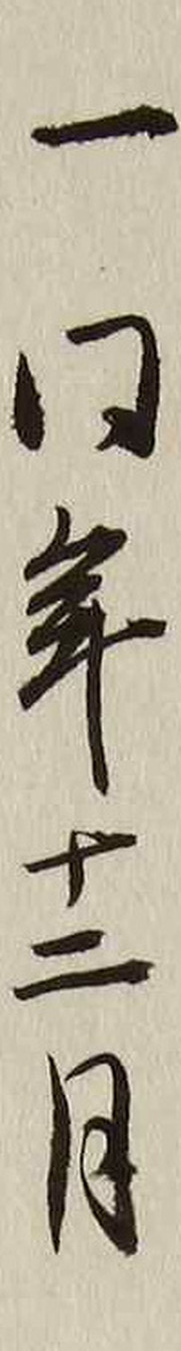一同年十二月
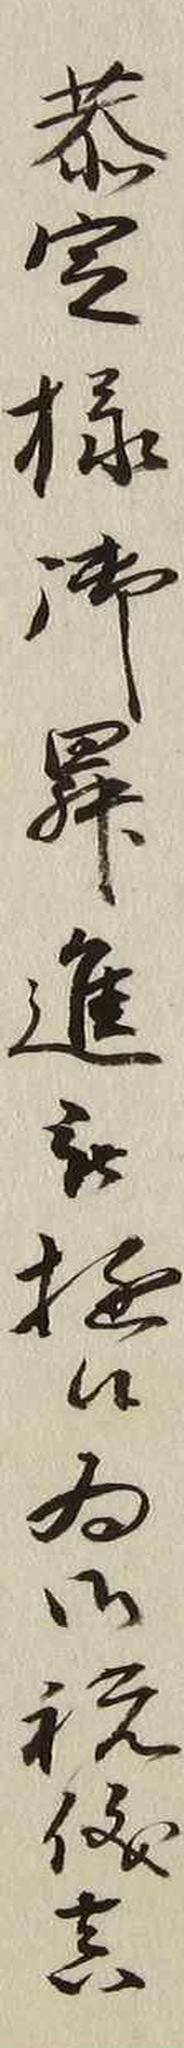恭定様御昇進被遊候為御祝儀真
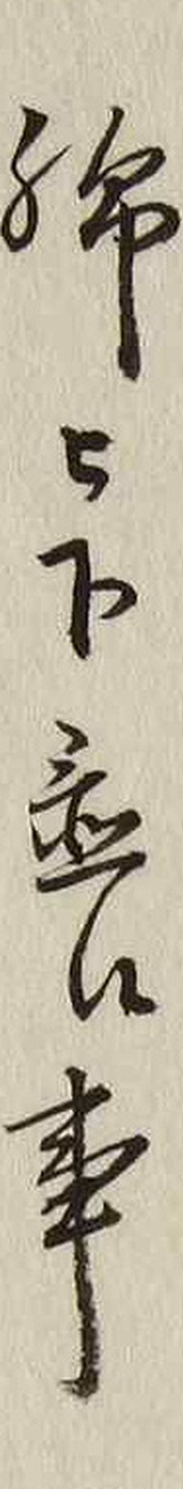綿被下置候事
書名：諸士系譜　巻之160　な之部2
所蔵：会津若松市立会津図書館
